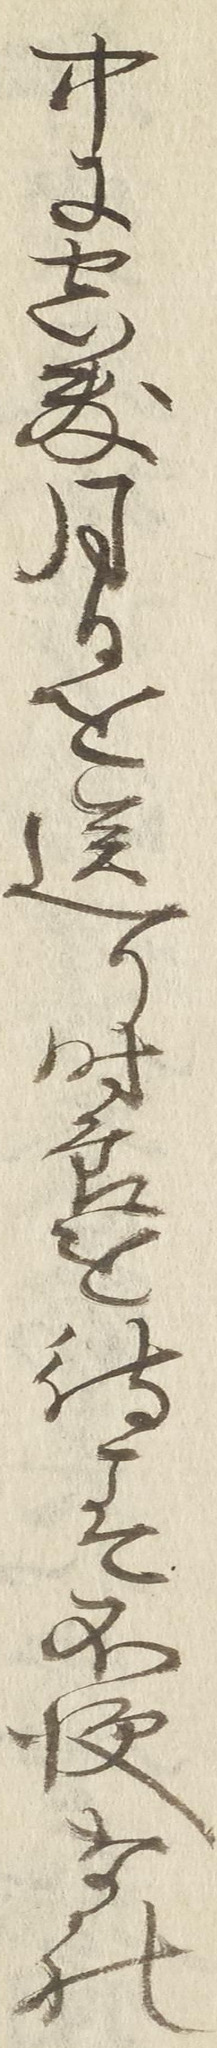中に空敷月日を送り時節を待は不便なれ
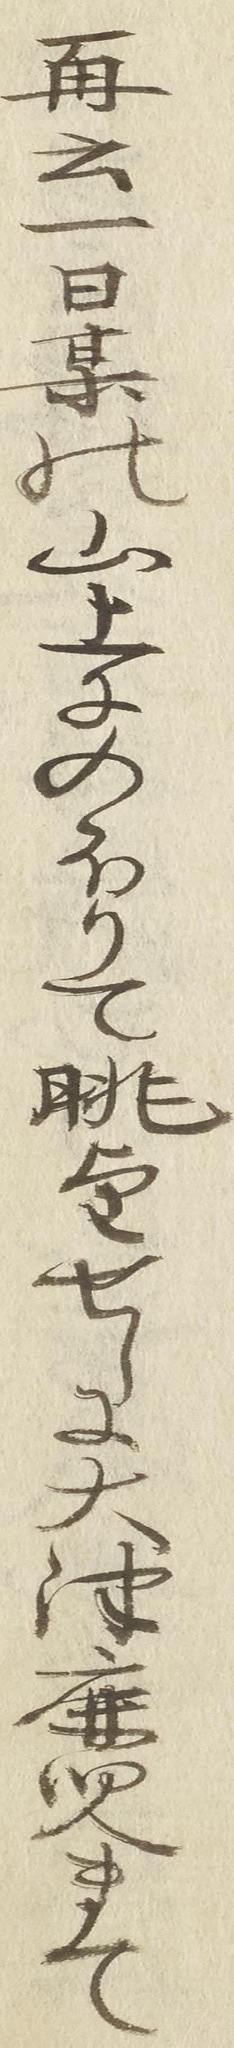再云一日某の山上にのほりて眺望せしに大津鹿児まて
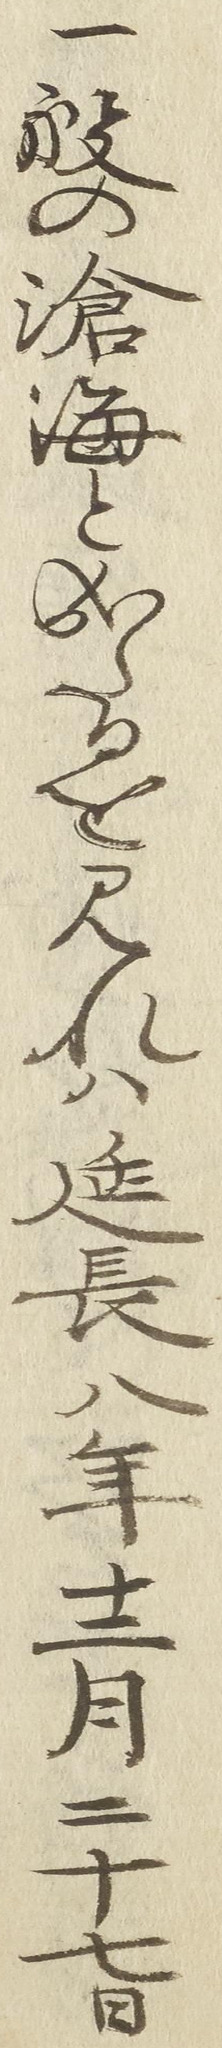一般の滄海と成たるを見れは延長八年十二月二十七日

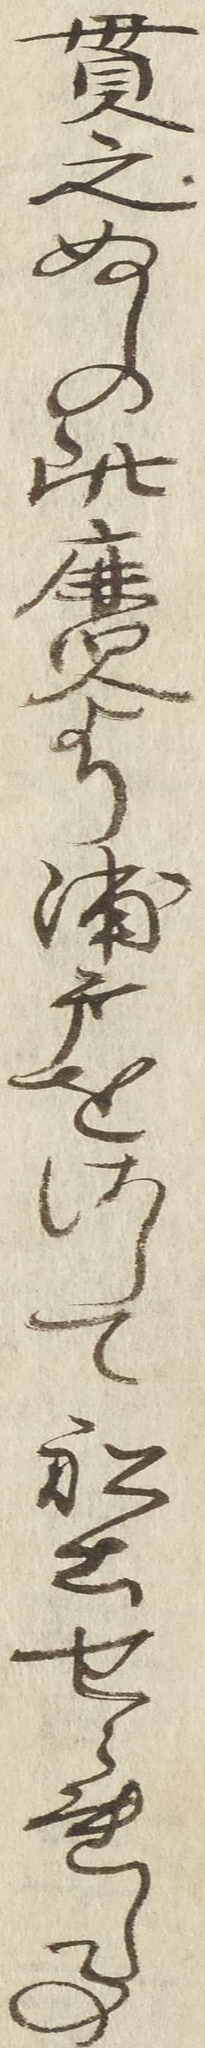貫之ぬしの此鹿児より浦戸をさして船出せられし事
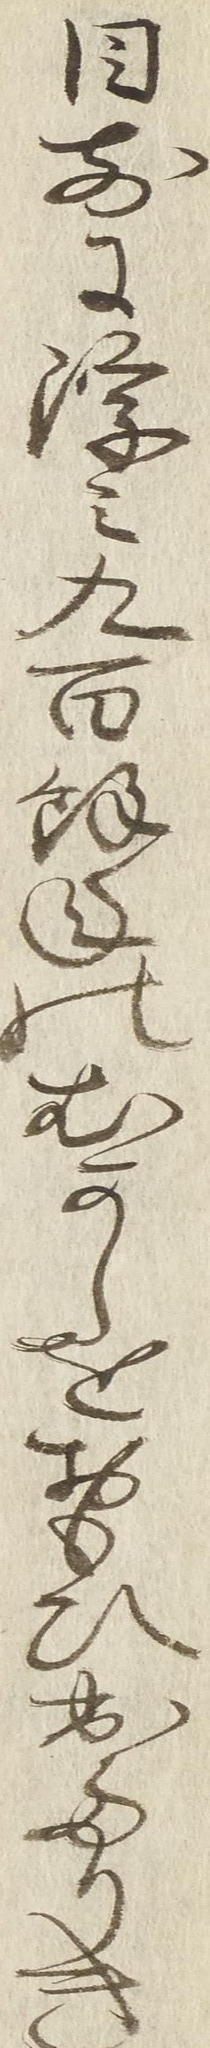目前に浮み九百余年のむかしを思ひ出たりき
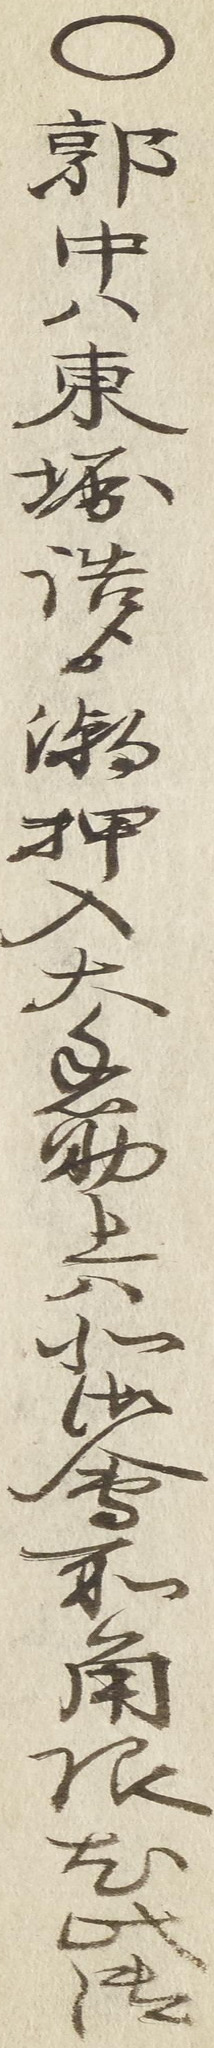〇郭中は東堀詰より潮押入大手筋上は北御会所角限尤此御
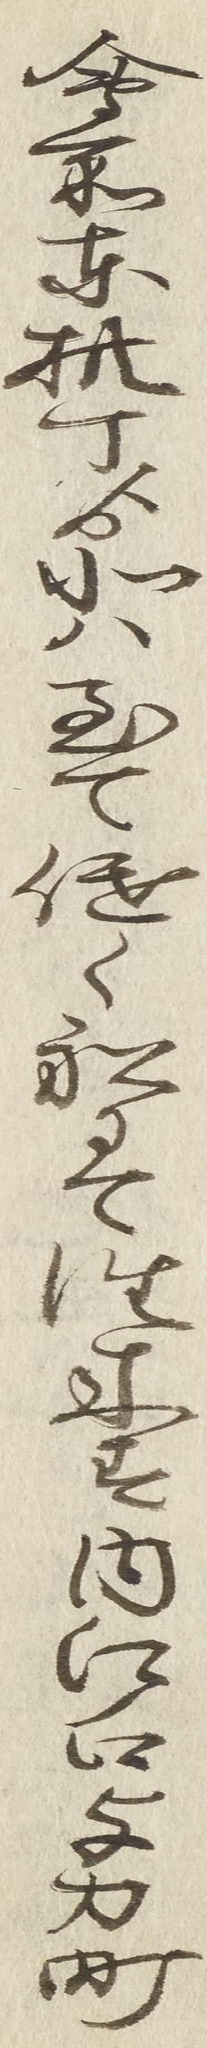会所東横丁より北は至て低く船にて往来す内江の口与力町
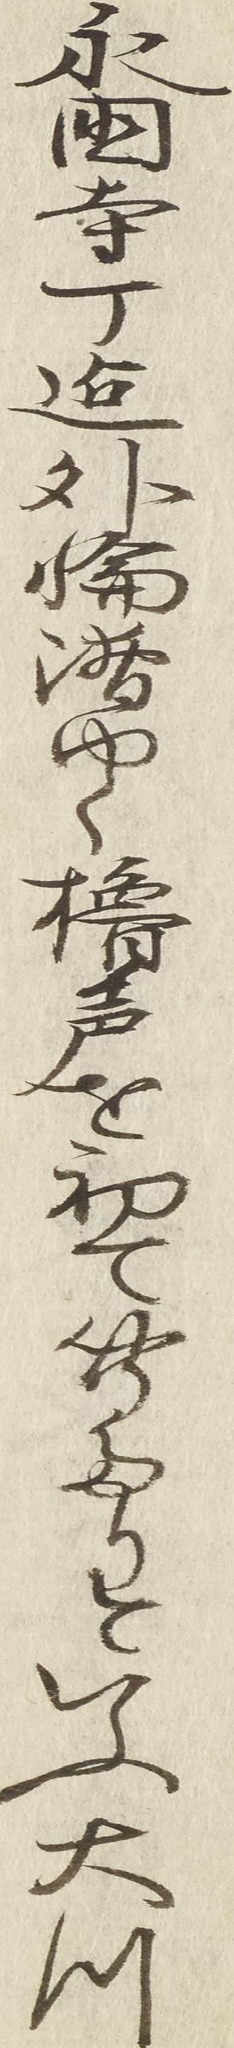永国寺丁迄外輪漕ゆく櫓声を初めて聞たりといふ大川
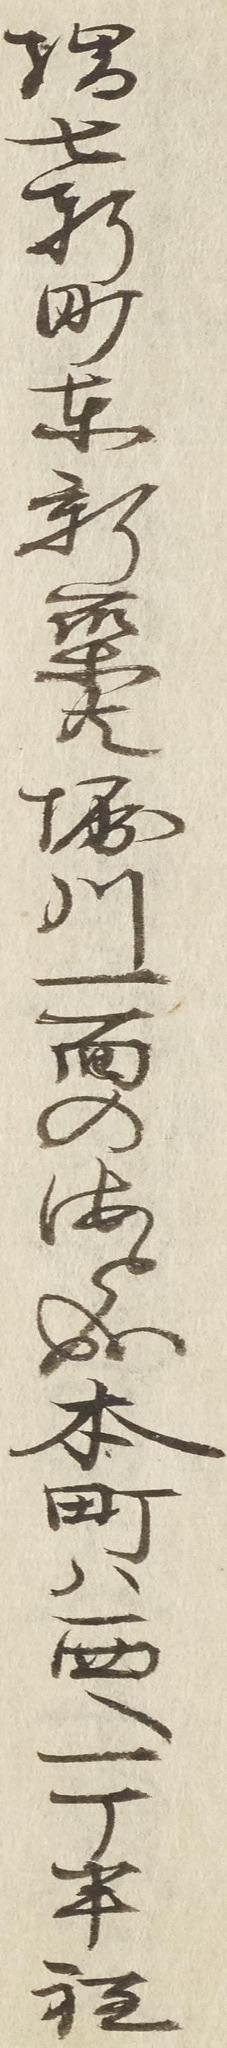端七軒町東新築共堀川一面の海と成本町は西へ一丁半程
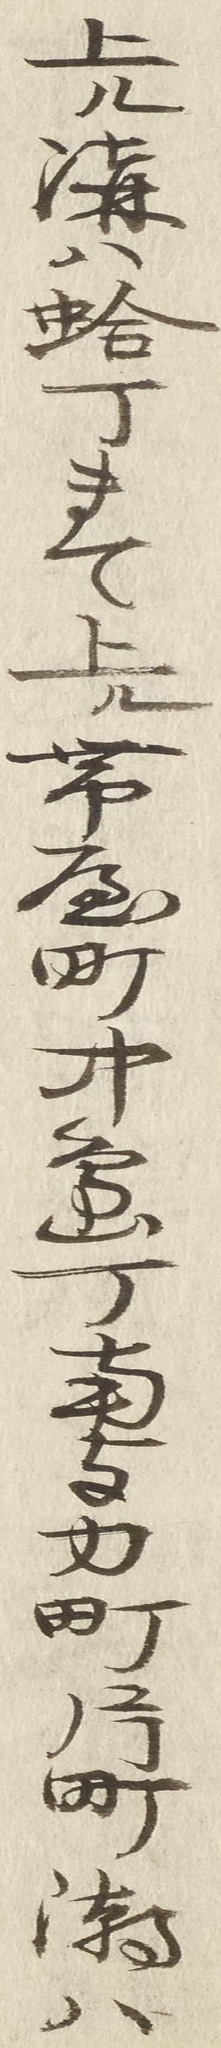上る溝は蛤丁まて上る帯屋町中島丁南与力町片町潮は
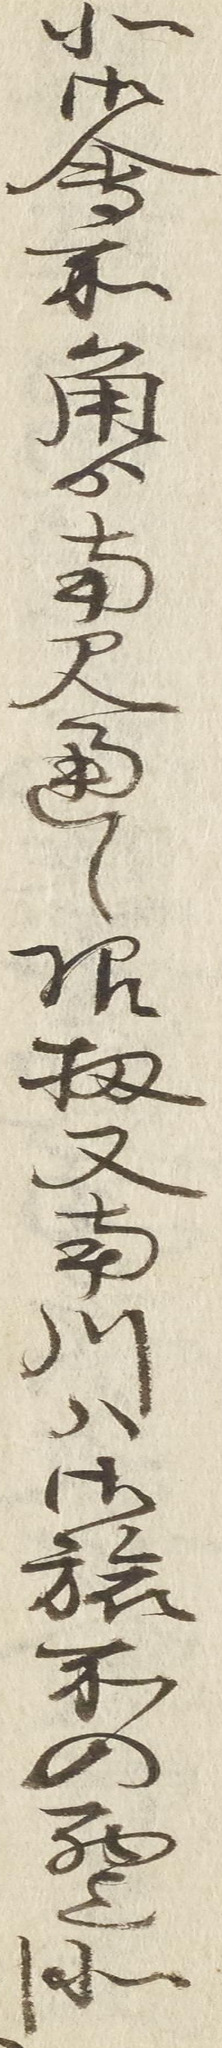北御会所角より南見通し限扨又南川は御旅所の西迄北川は
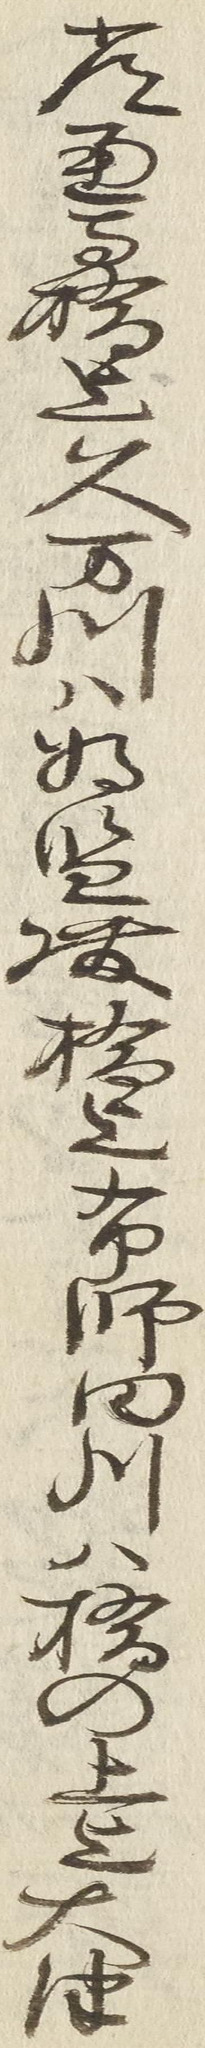常通寺橋迄久万川は将監殿橋迄布師田川は橋の上迄大津
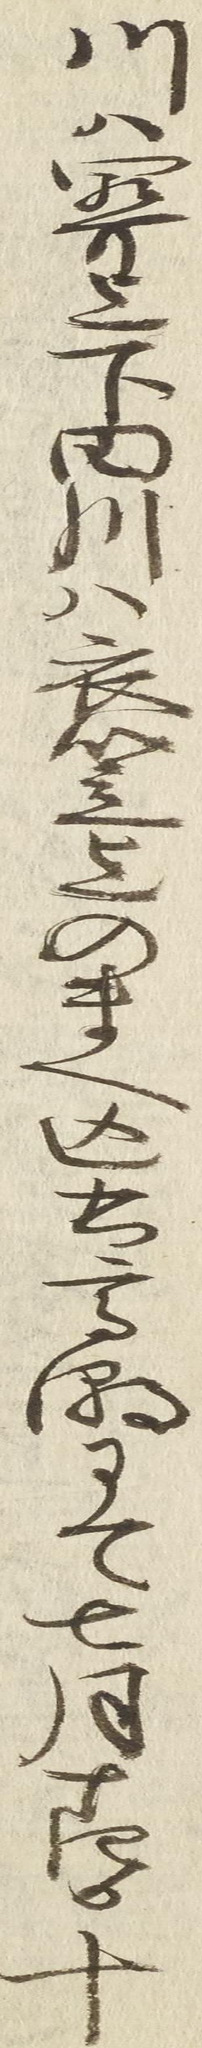川は関迄下田かわは衣笠迄のまへ込出高潮にて七月十四日十
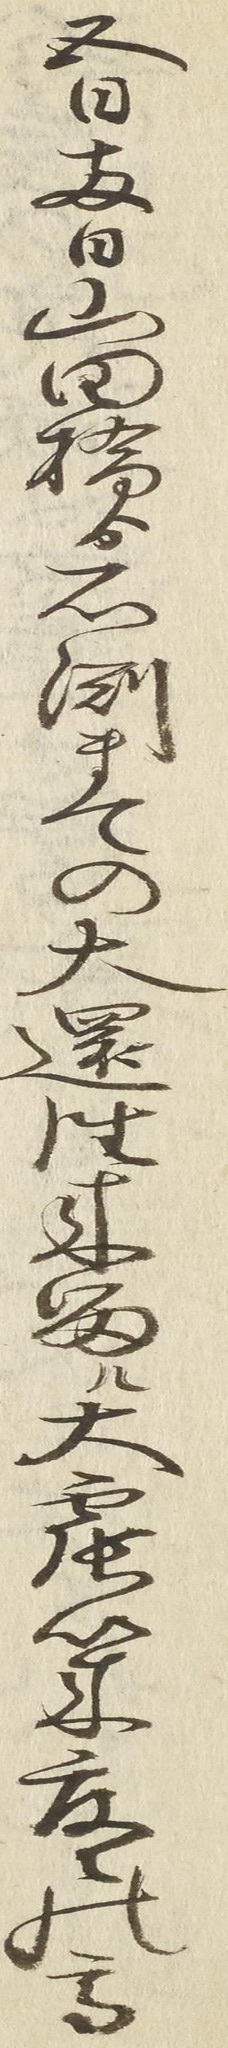五日両日より山田橋石淵まての大還往来留る大震以来度々の高
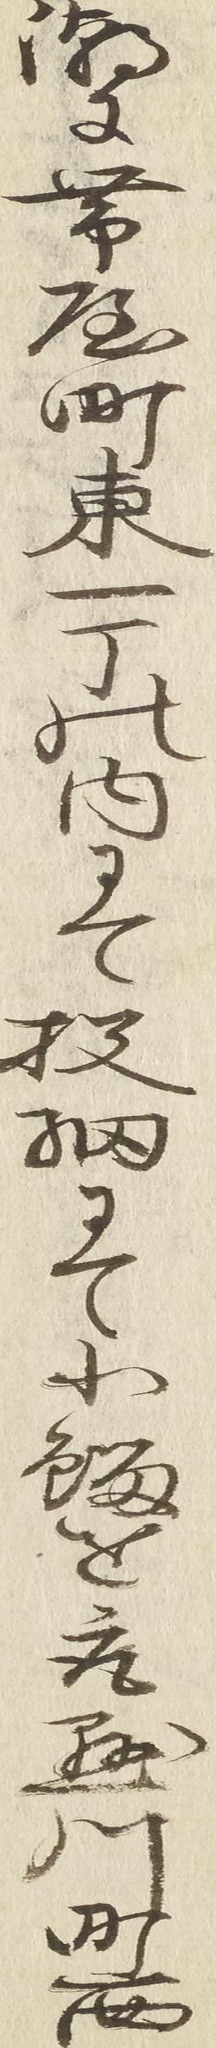潮に帯屋町東一丁の内にて投網にて小鯔を取懸川町西
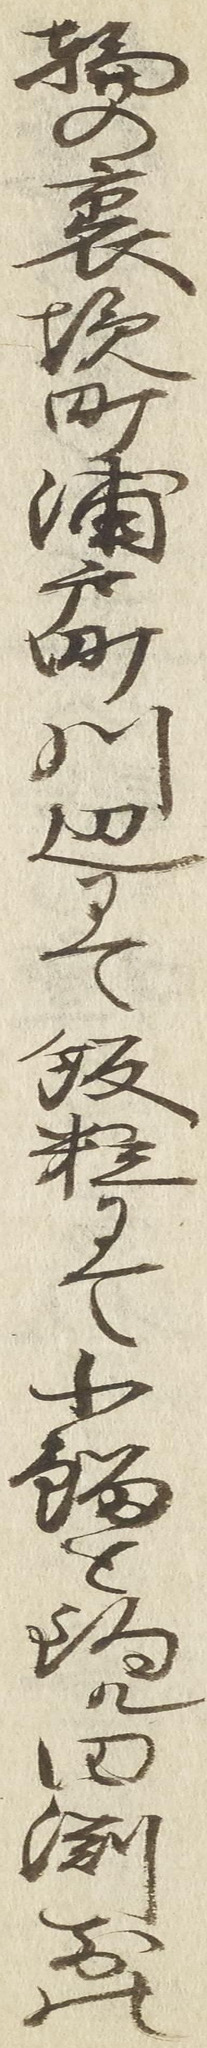輪の裏境町浦戸町川辺にて飯粒にて小鯔を釣る田渕前の
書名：地震記　上
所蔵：東京大学地震研究所図書室 Earthquake Research Institute Library, The University of Tokyo, JAPAN
